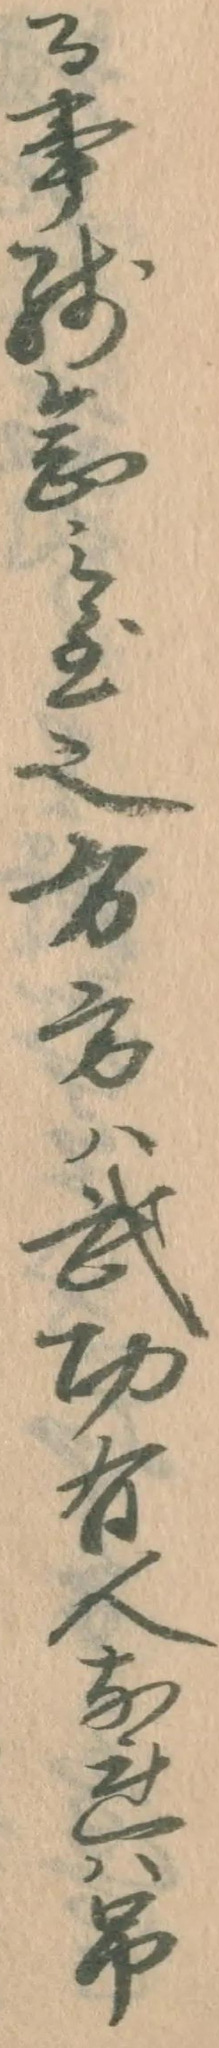る事残念之至也方方は武功有人な連は弔
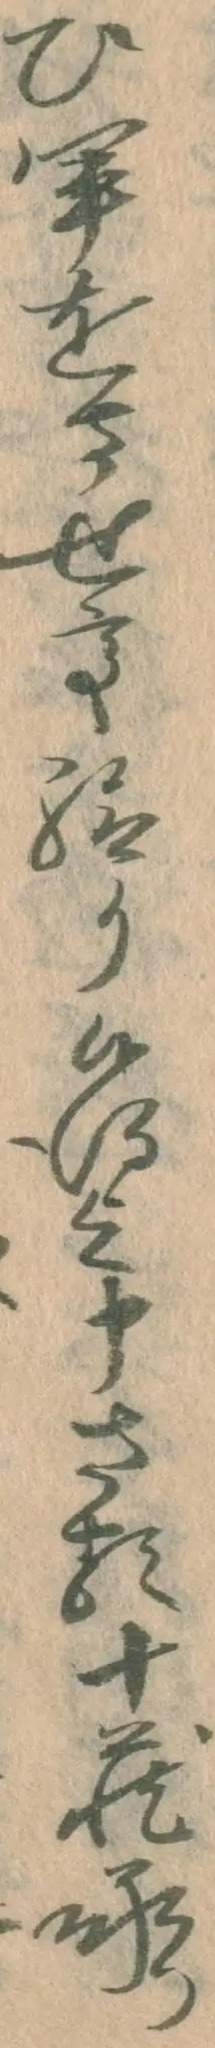ひ軍をさせ亭給り候得与申さ類十蔵承り
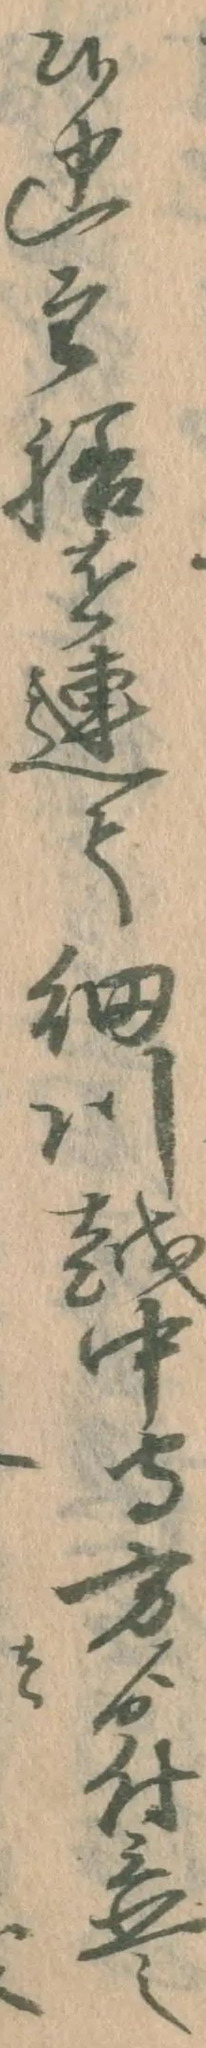候迚主膳を連て細川越中守方ゟ仕置し
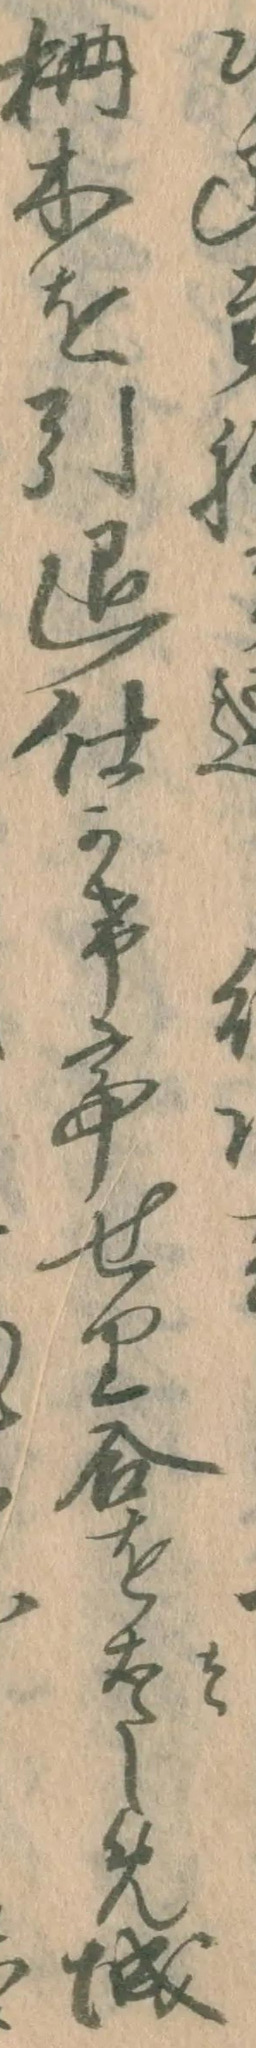柵木を引退仕可申希亭せ里合を者し免城
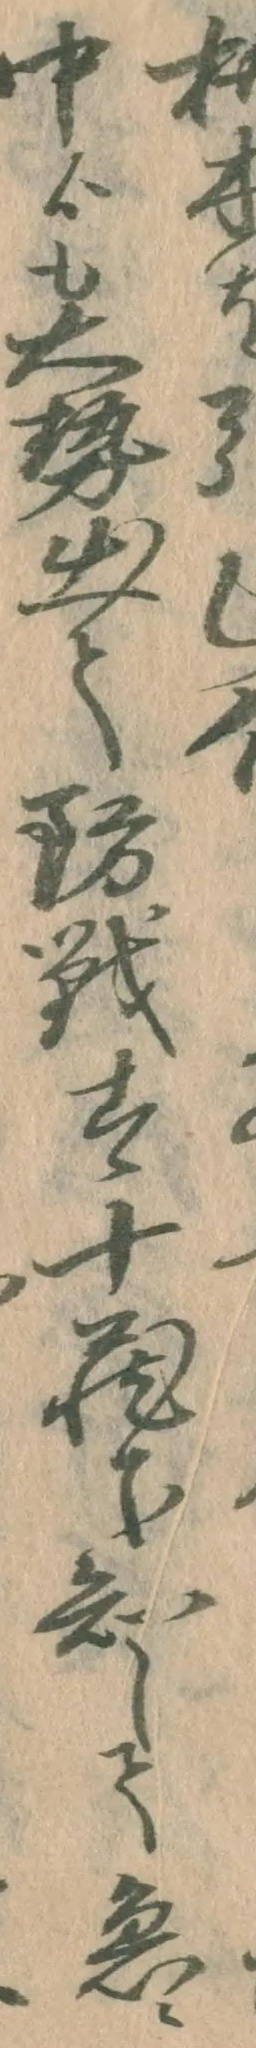中ゟも大勢出て防戦春十蔵下知して急に
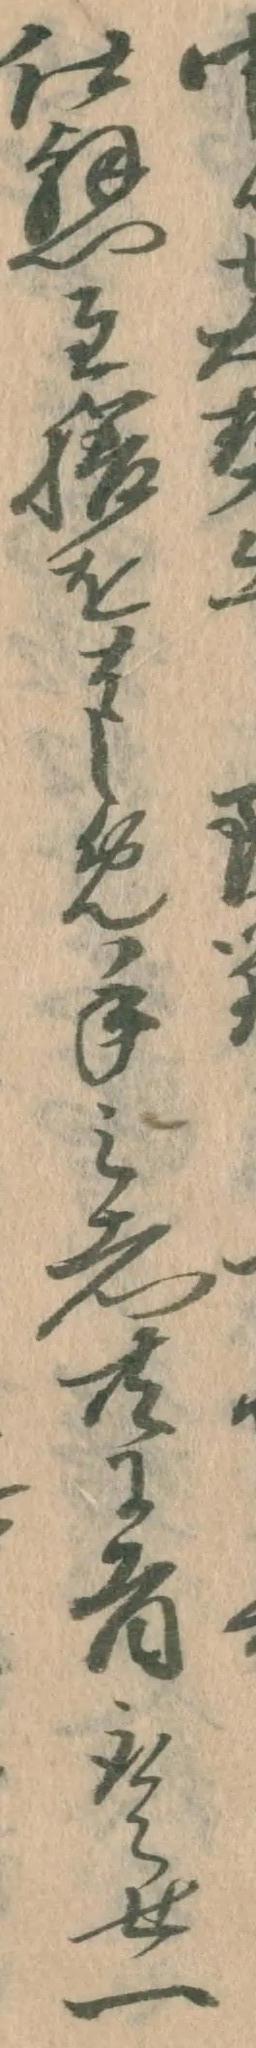仕懸主膳を者し免手之者共尓首取らせ一
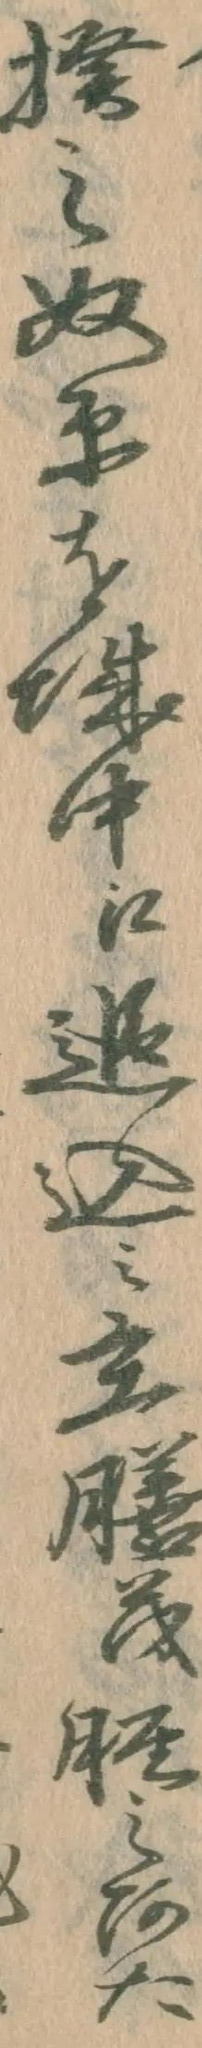揆之奴原を城中江追込み主膳茂腰之阿た
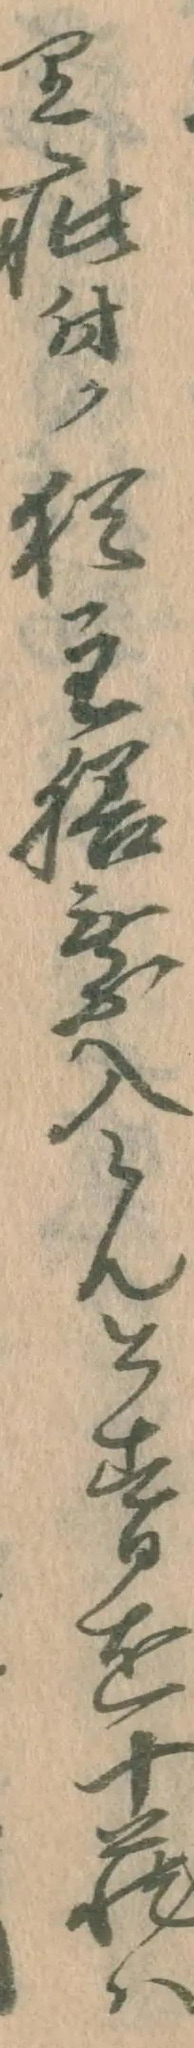里疵付く猶主膳乗入らんと春るを十蔵は
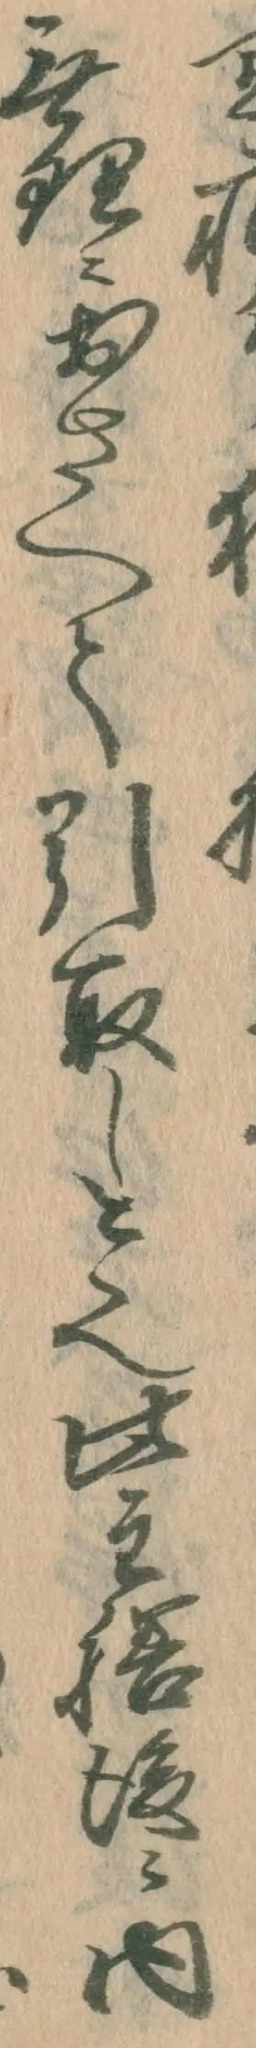無理におさへて引取しと也此主膳後に内
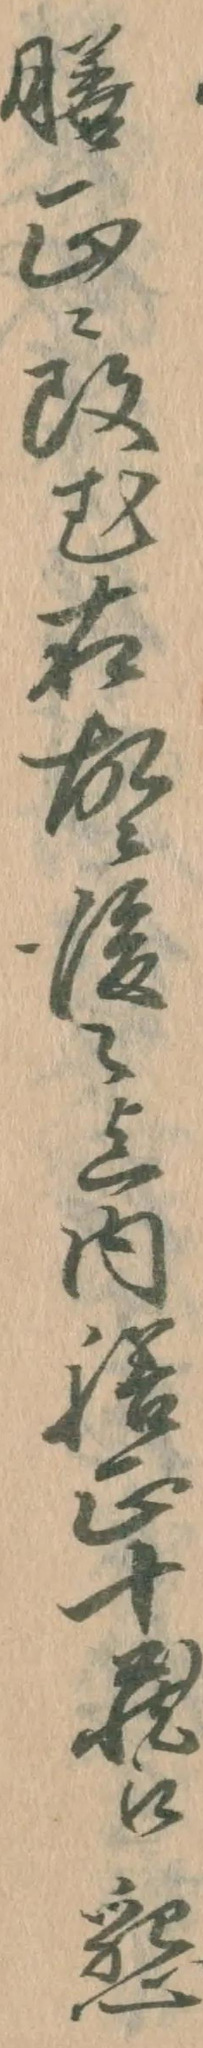膳正に改む右故に後々迄内膳正十蔵江懇
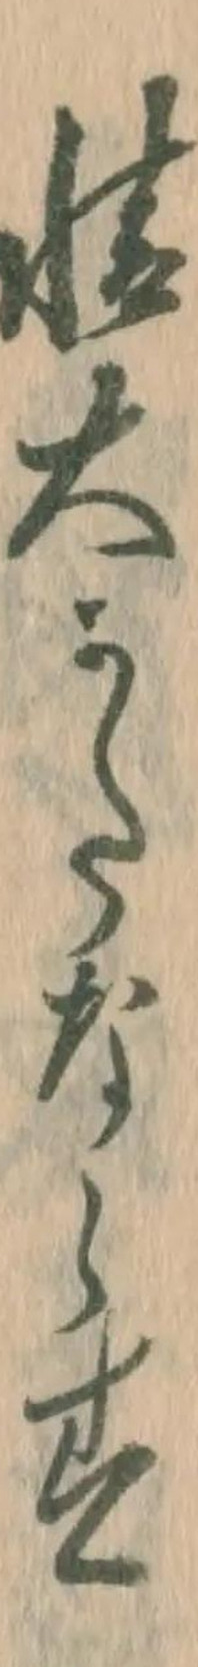情大可たなら春
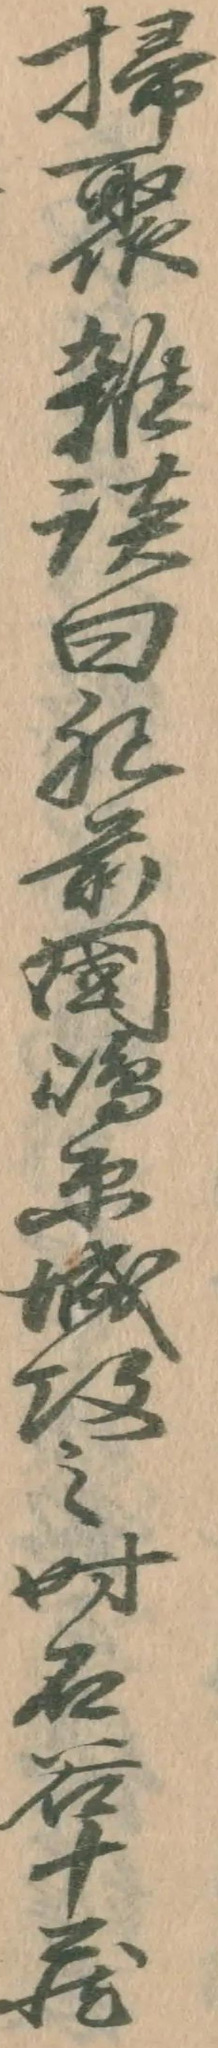掃聚雑談曰肥前国島原城攻之時石谷十蔵
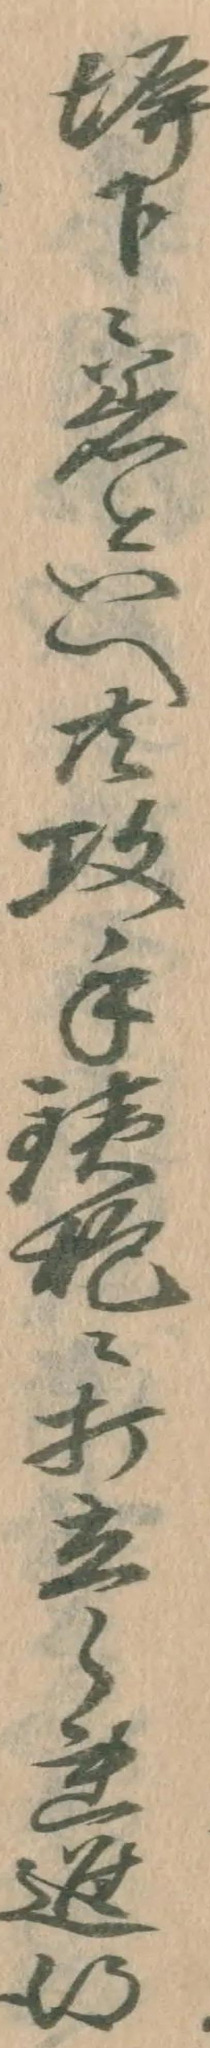塀下に着といへ共攻手鉄炮に打立ら連進得
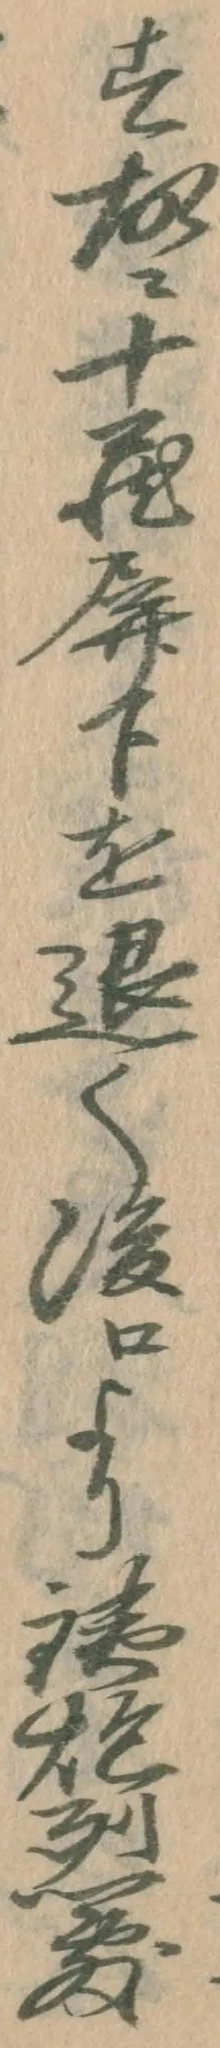春故に十蔵屏下を退く後口より鉄炮烈敷
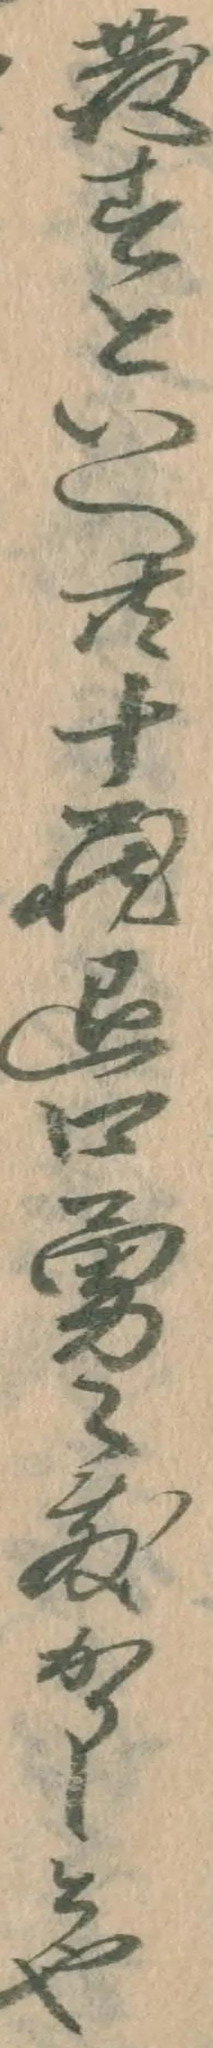発春といへ共十蔵退口勇々敷かうしとや
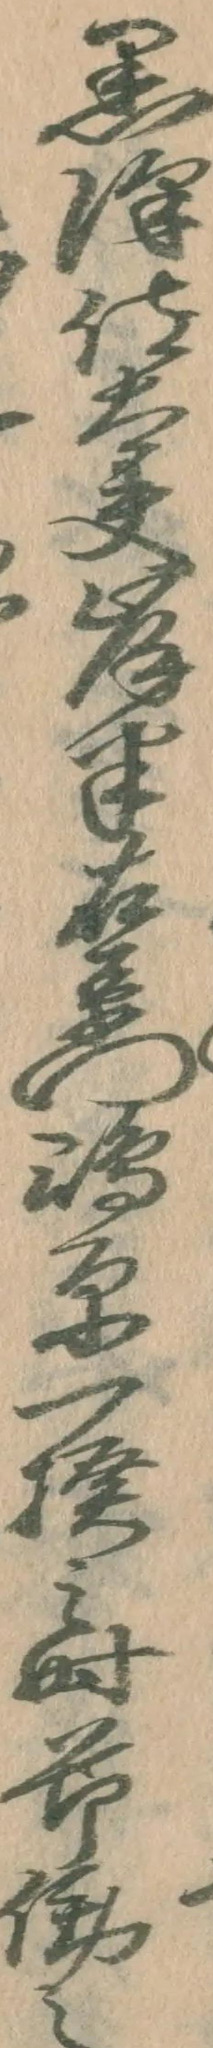黒沢佐太夫岸半右衛門島原一揆之時節働之
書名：切支丹御退治記 49巻. [5]
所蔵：国立国会図書館 National Diet Library, JAPAN
